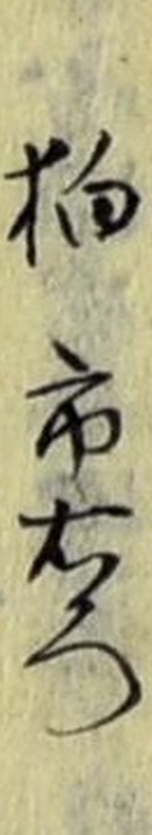狛市右衛門

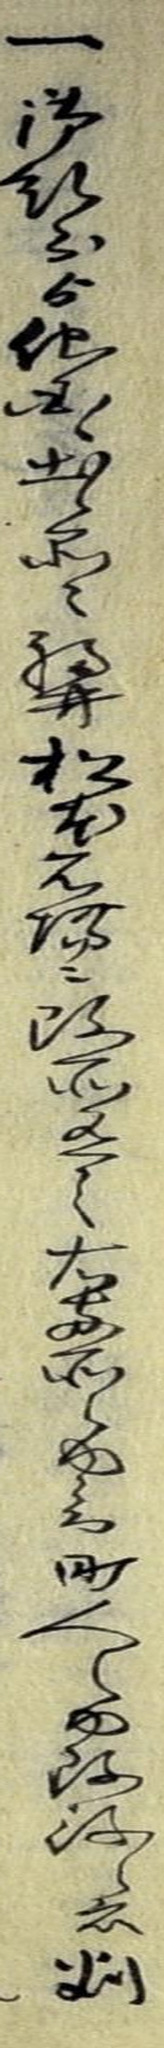一御領分ゟ他国へ出候品々福井松本石場ニ改所有之右両所之内ニ而町人之内改役之者判
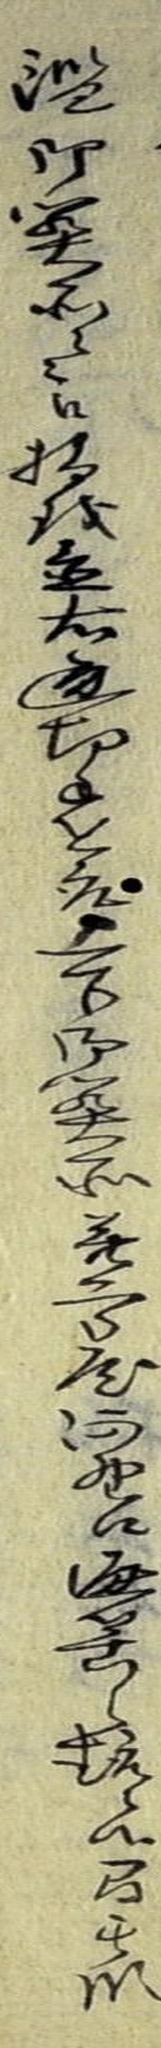鑑御関所々々江指越置右通切手を取上下御関所并二ツ屋河野口通筈之趣ニ候間其段
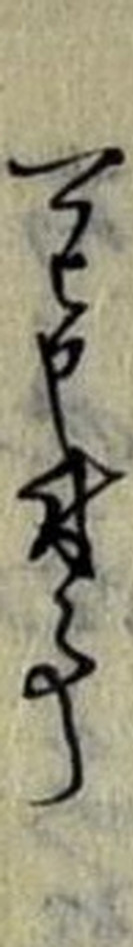可被申付事
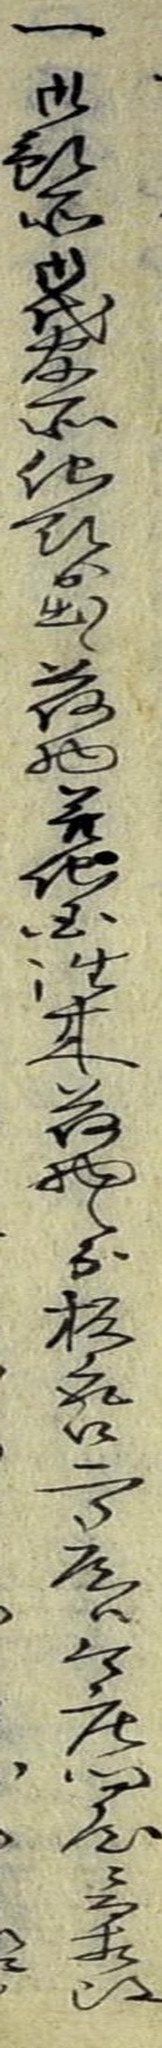一御預所御代官所他領ゟ出候荷物并他国往来荷物之分板取口二ツ屋ハ今庄問屋ニ而相改
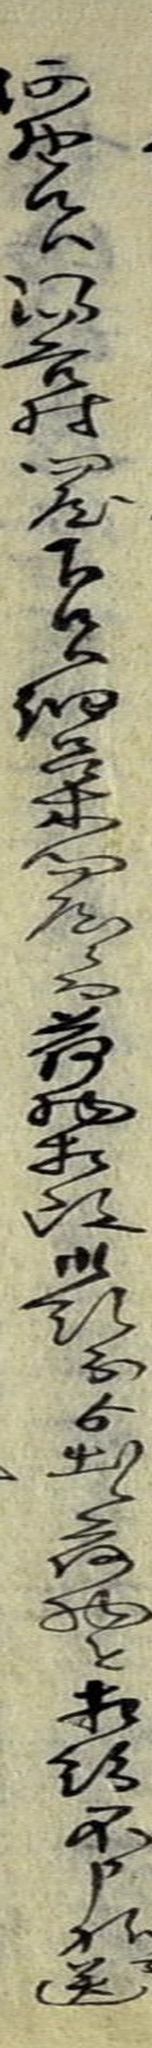河野口ハ湯谷村問屋下口ハ細呂木問屋ニ而荷物相改御領分ゟ出候荷物と相紛不申様ニ送
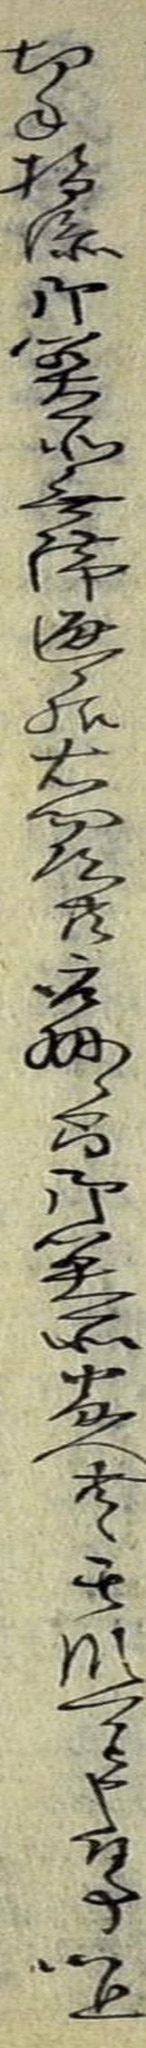切手指添御関所無滞通候様右問屋共取扱候間御関所番人共へ其段可被申付事以上
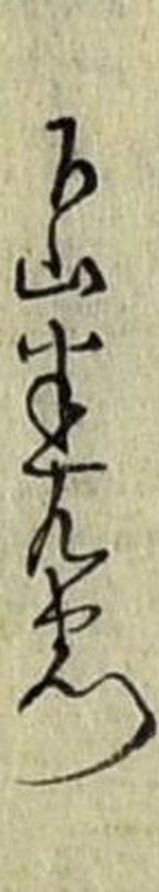下山半左衛門
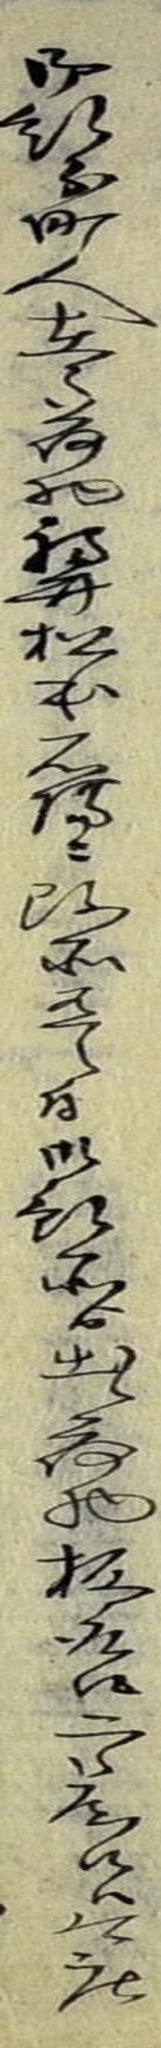御領分町人在々荷物福井松本石場ニ改所有之ニ付御領所ゟ出候荷物板取口二ッ屋口ハ今庄
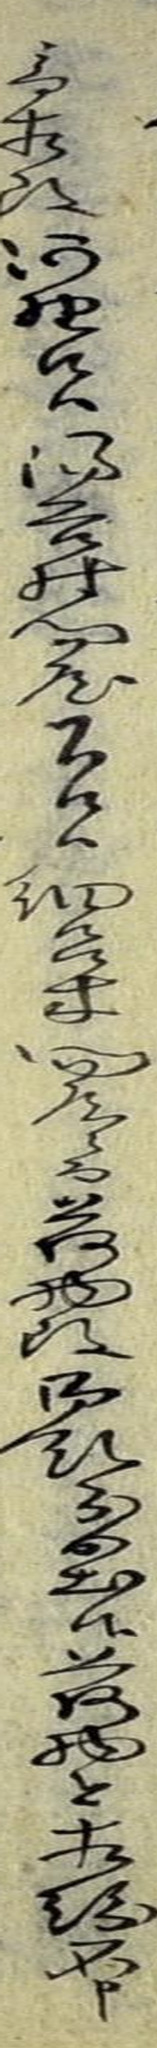ニ而相改河野口ハ湯谷村問屋下口ハ細呂木問屋ニ而荷物改御領分ゟ出候荷物と相紛不申
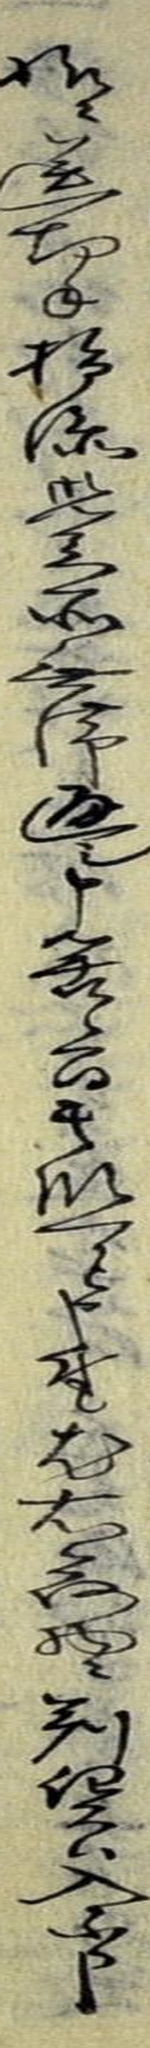様ニ送切手指添御関所無滞通シ申筈候間其段可被申付候尤右荷物ニ判賃ハ入不申
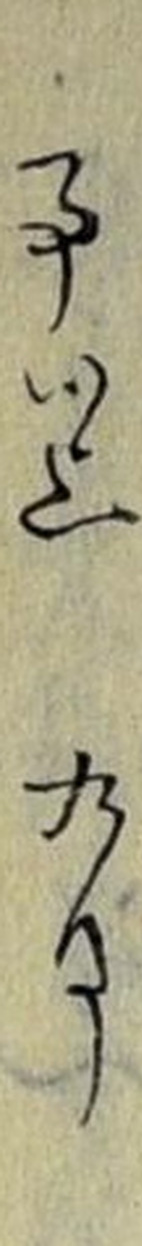事以上九月
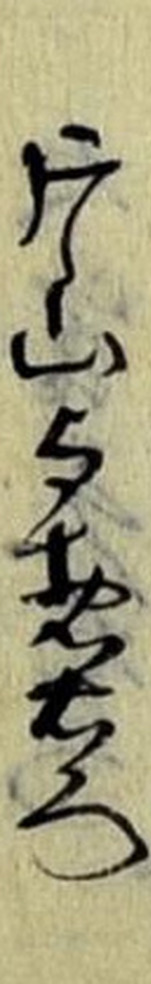片山与惣右衛門
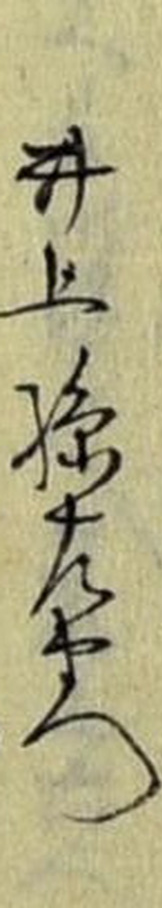井上孫左衛門
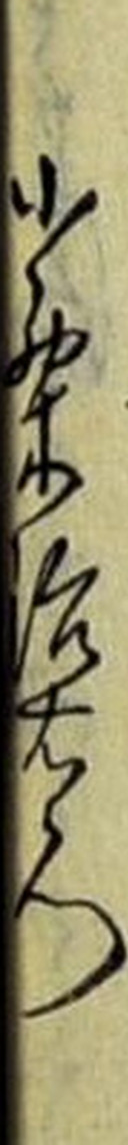小栗治右衛門
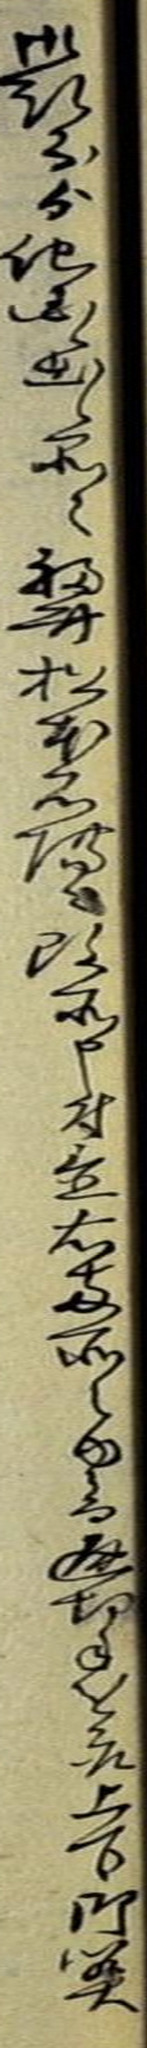一御領分ゟ他国へ出候品々福井松本石場ニ改所申付置右両所之内ニ而通切手を取上下御関
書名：命令之部 一
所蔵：福井県文書館 Fukui Prefectural Archives
